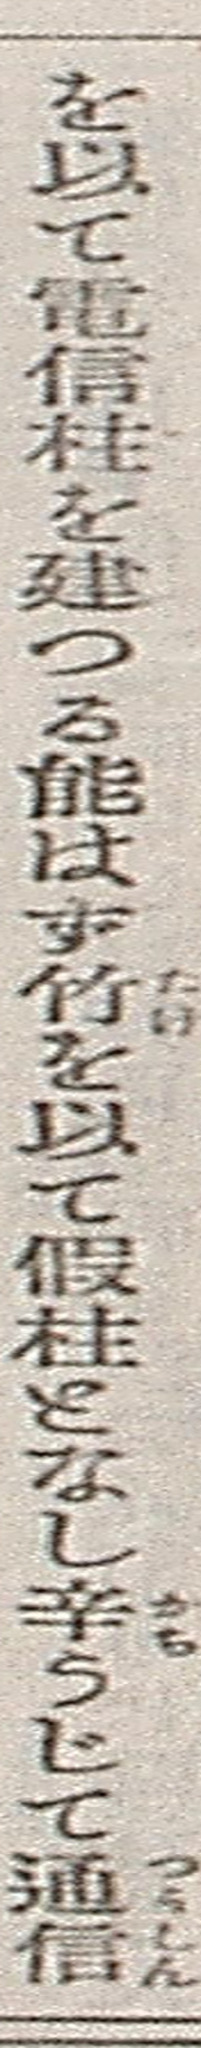を以て電信柱を建つる能はず竹を以て仮柱となし辛うじて通信
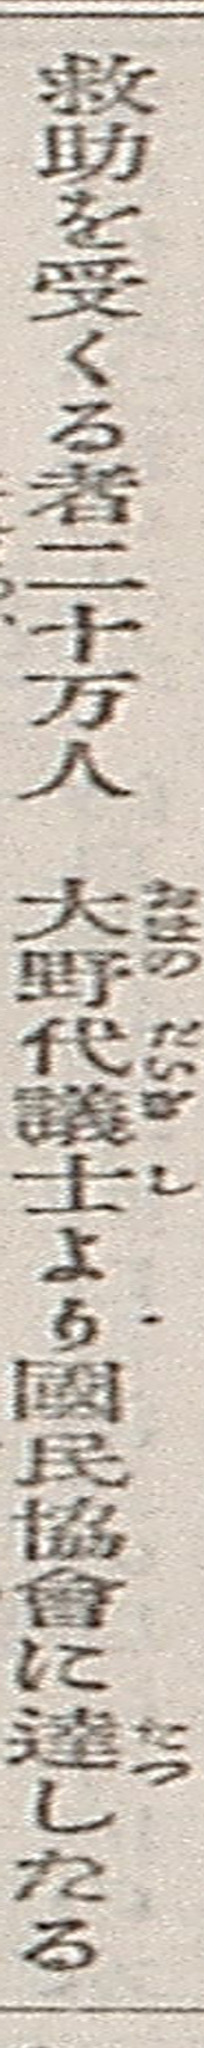救助を受くる者二十万人大野代議士より国民協会に達したる
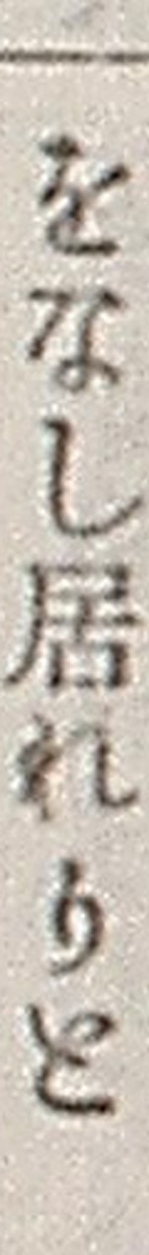をなし居れりと
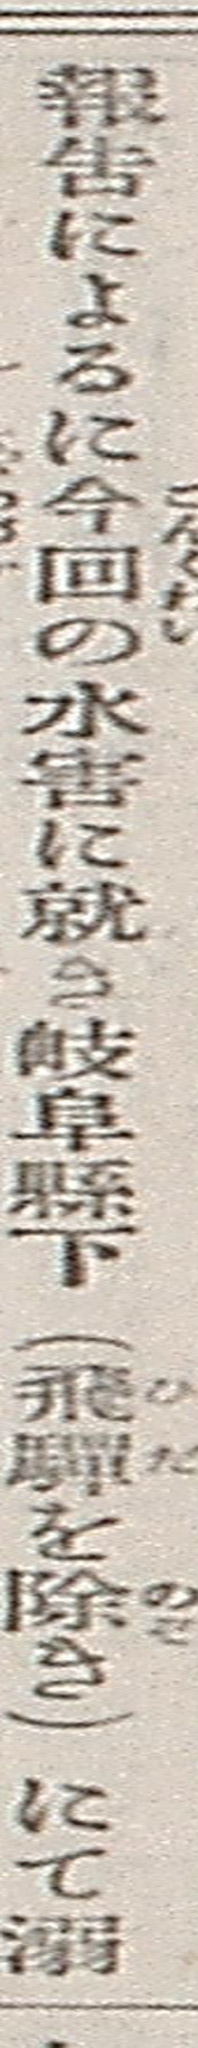報告によるに今回の水害に就き岐阜県下を除き）にて溺
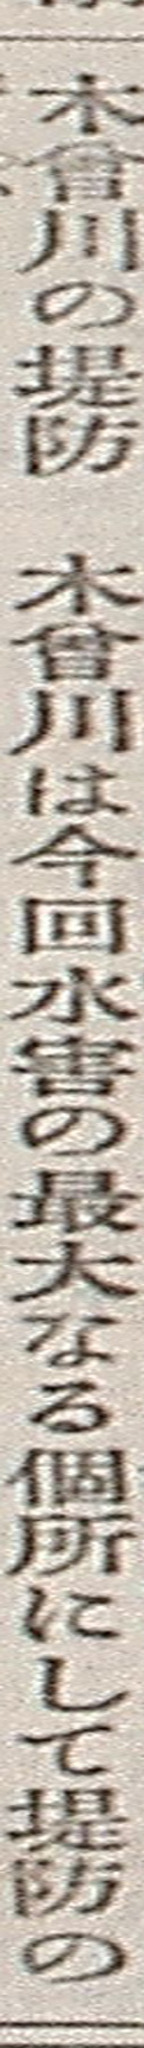木曽川の堤防木曽川は今回水害の最大なる箇所にして堤防の
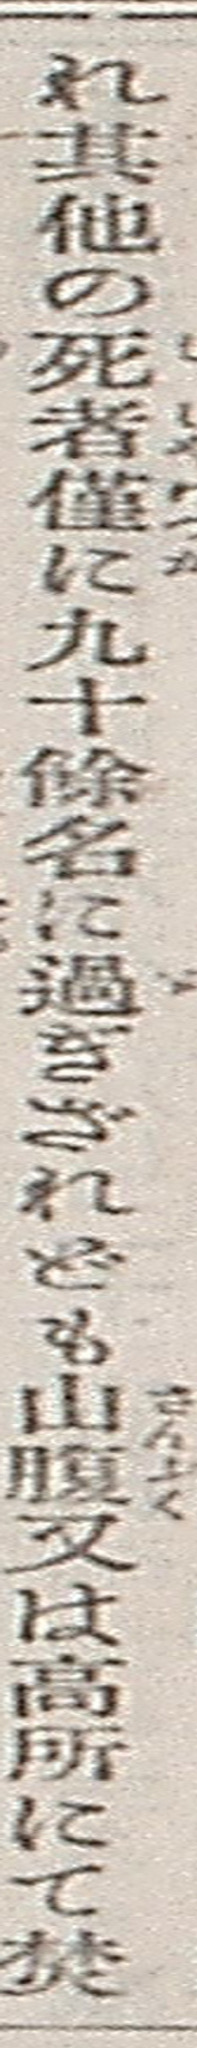れ其他の死者僅に九十餘名に過ぎざれども山腹又は高所にて焚
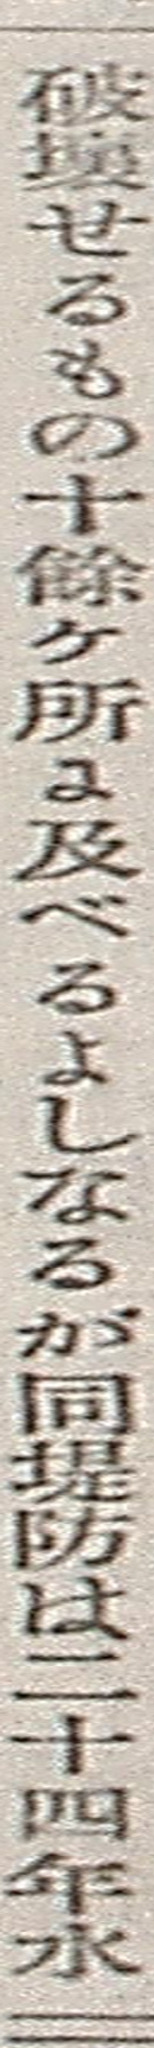破壊せるもの十餘ヶ所に及べるよしなるが同堤防は二十四年水
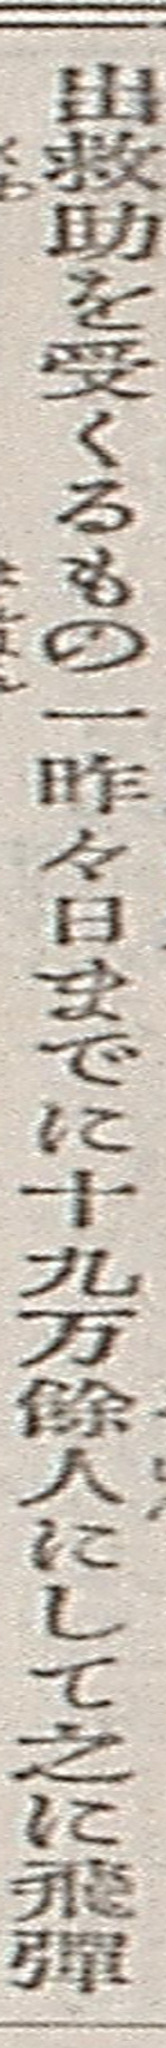出救助を受くるもの一昨々日までに十九万餘人にして之に飛騨
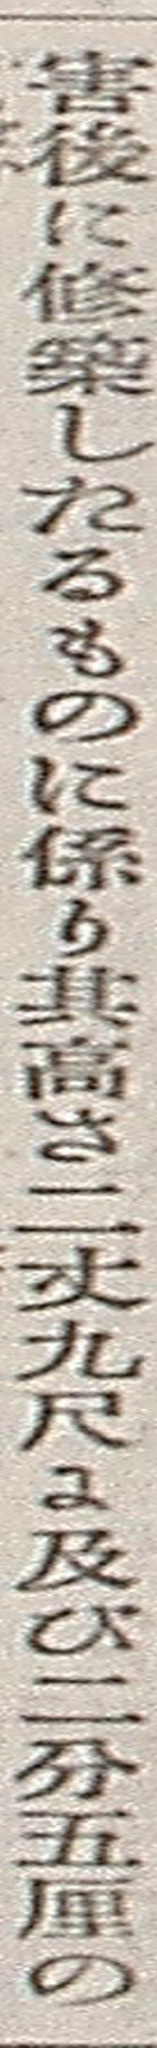害後に修築したるものに係り其高さ二丈九尺に及び二分五厘の
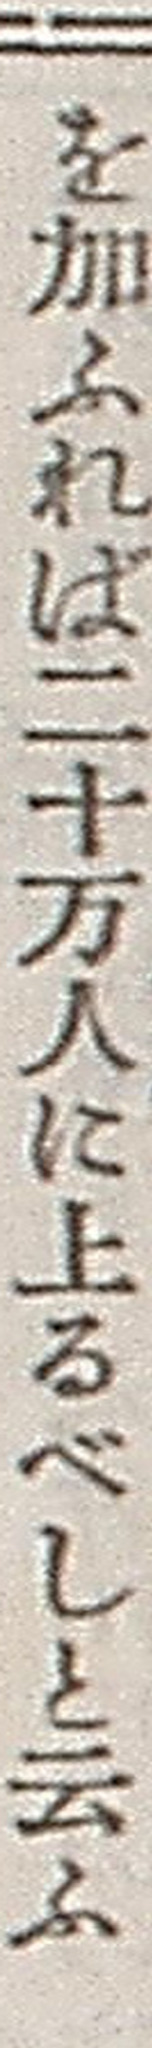を加ふれば二十万人に上るべしと云ふ
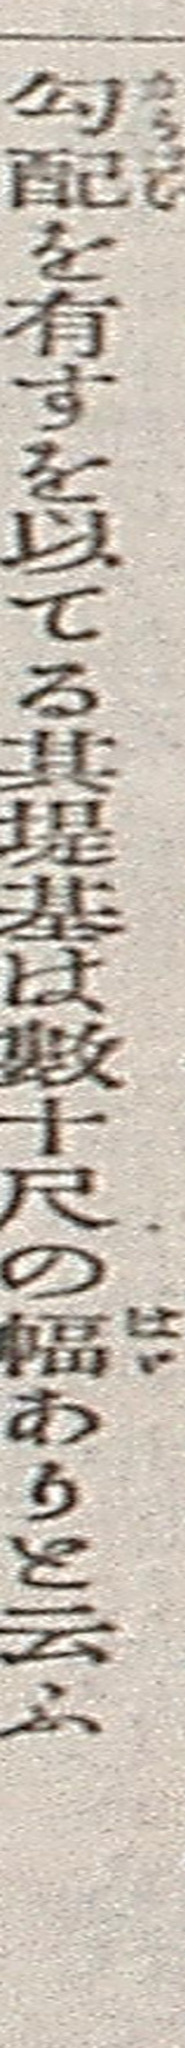勾配を有すを以てる其堤基は数十尺の幅ありと云ふ
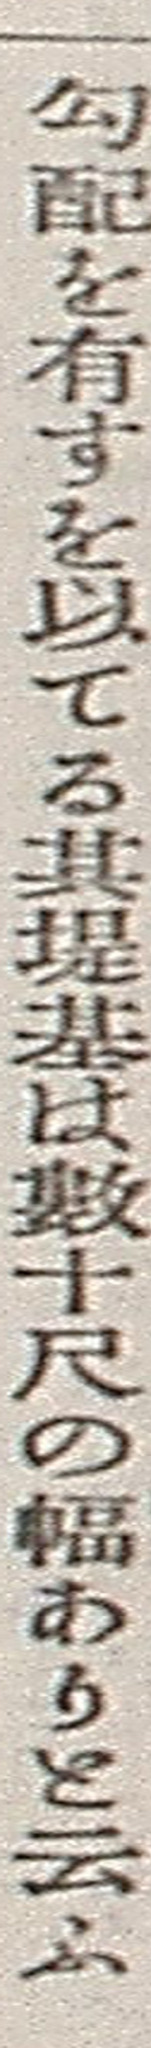勾配を有すを以てる其堤基は数十尺の幅ありと云ふ

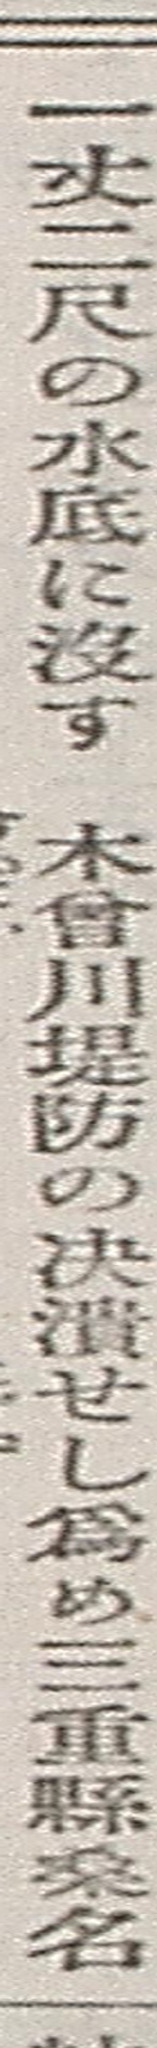一丈二尺の水底に没す木曽川堤防の决潰せし為め三重県桑名
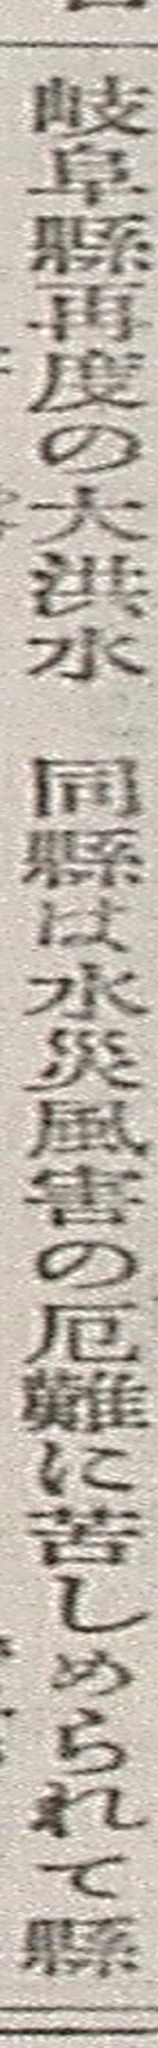岐阜県再度の大洪水同縣は水害風害の厄難に苦しめられて県
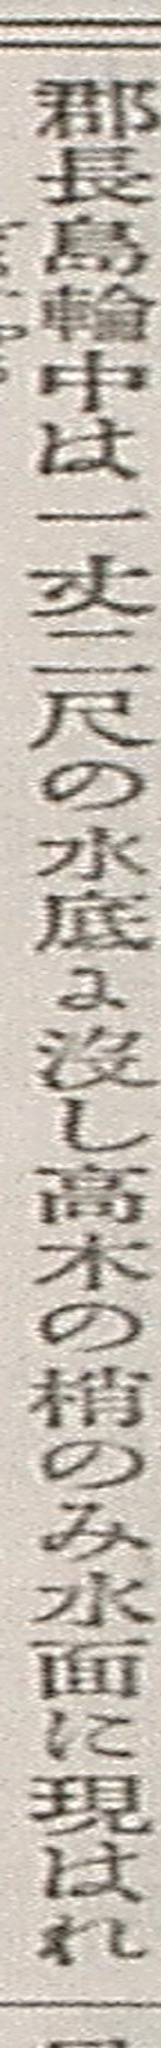郡長嶋輪中は一丈二尺の水底に没し高木の梢のみ水面に現はれ
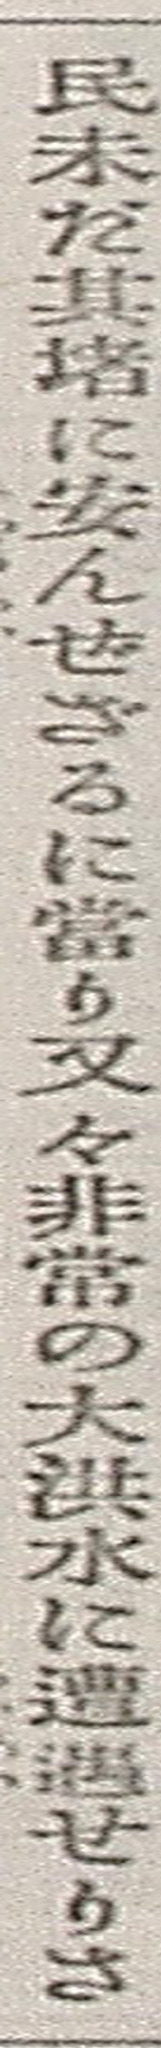民未だ其堵に安んぜざるに当り又々非常の大洪水に遭遇せりさ
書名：風俗畫報臨時増刊第百二十六號　洪水被害録（中）
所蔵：東京大学地震研究所図書室 Earthquake Research Institute Library, The University of Tokyo, JAPAN
